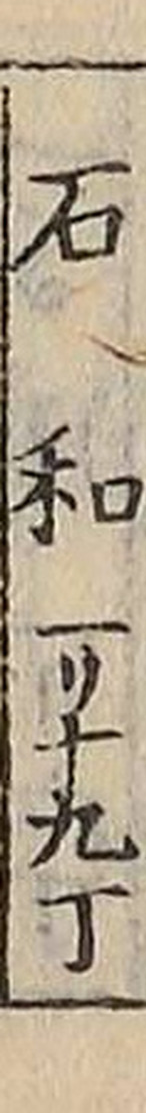石和一リ十九丁
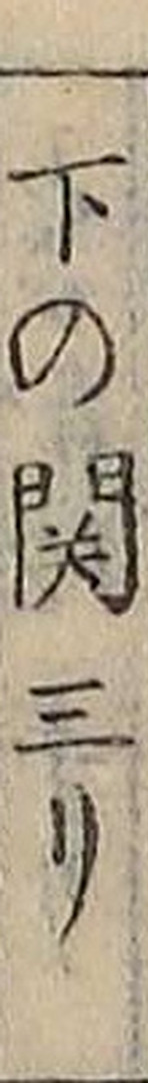下の関三リ
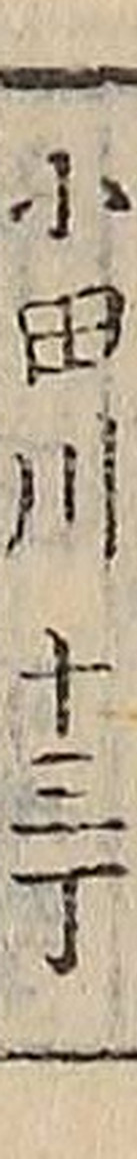小田川十三丁
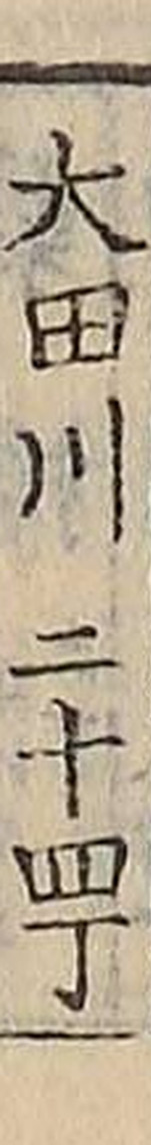大田川二十四丁
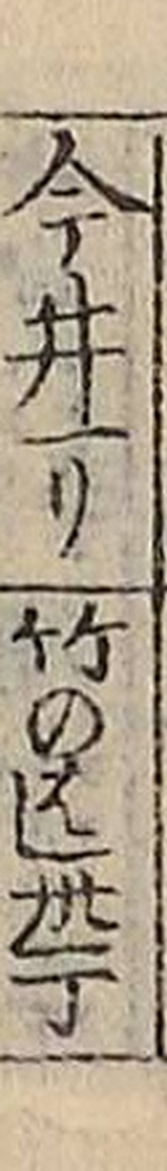今井一リ竹のはし卅一丁
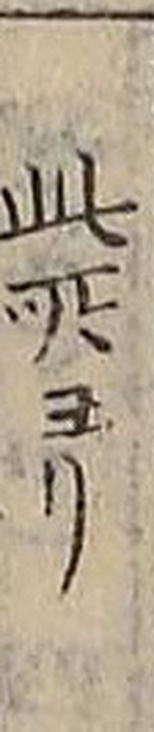此所ヨり
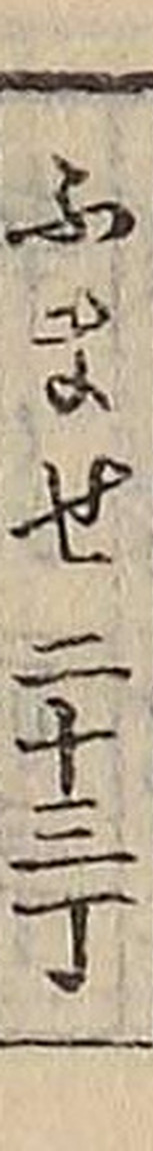ふませ二十三丁
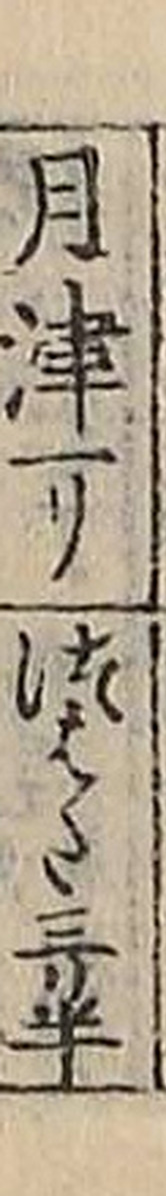月津一リつはた三リ半
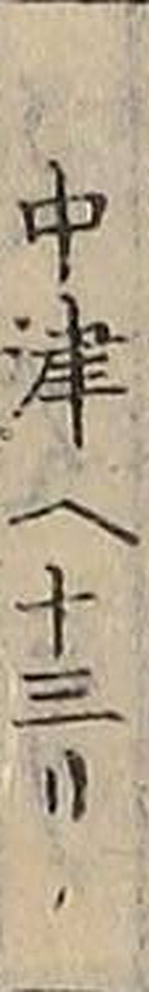中津へ十三リ
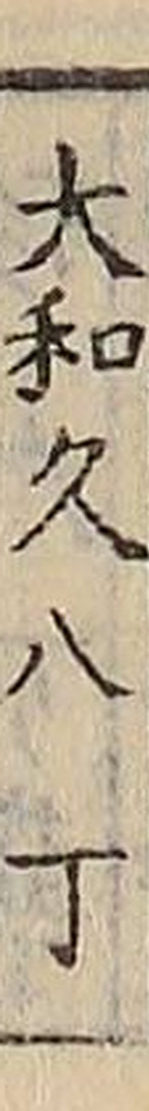大和久八丁
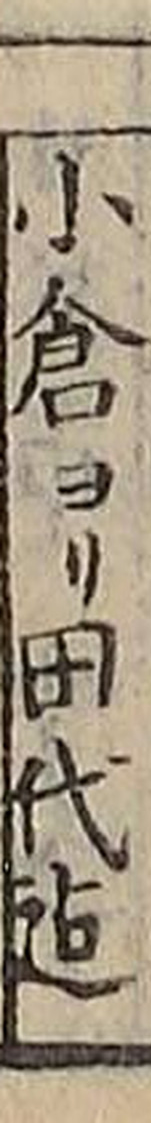小倉ヨリ田代迄
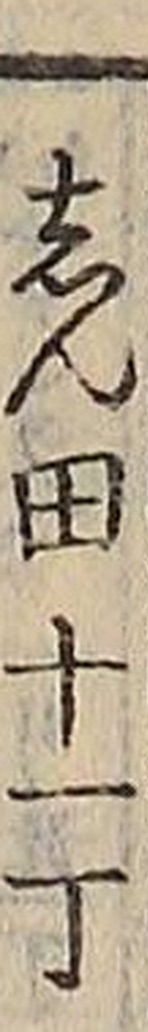しん田十一丁
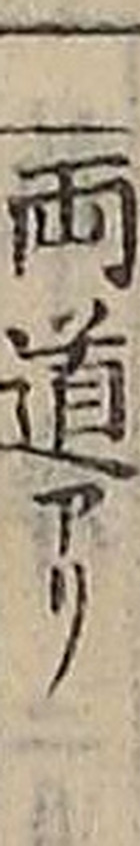両道アリ
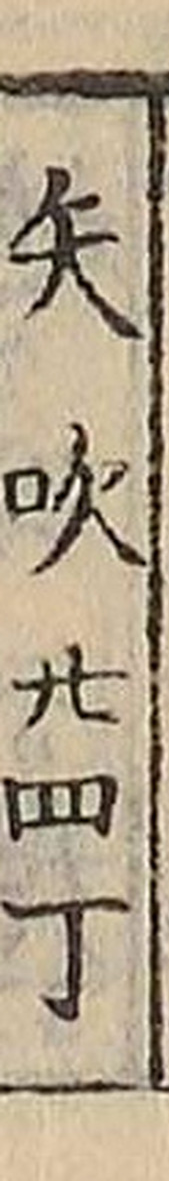矢吹廿四丁
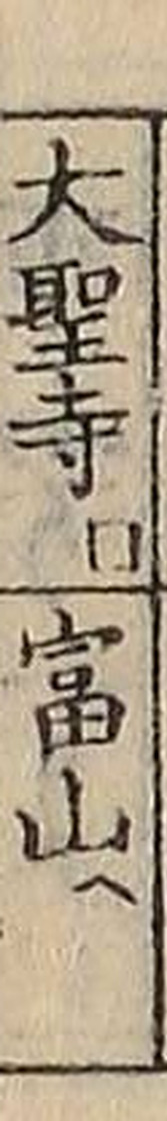大聖寺▫富山へ
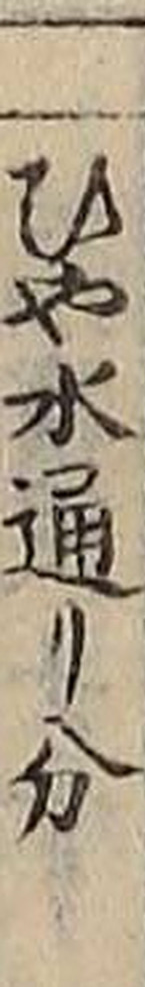ひや水通り分
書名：旅行用心集
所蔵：神戸大学附属図書館 国文学研究資料館
